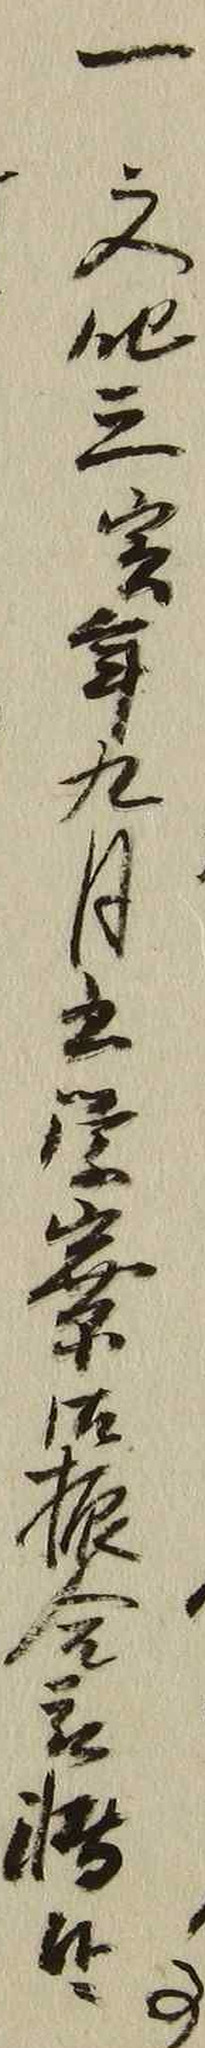一文化三寅年九月書学寮御振合被転候ニ
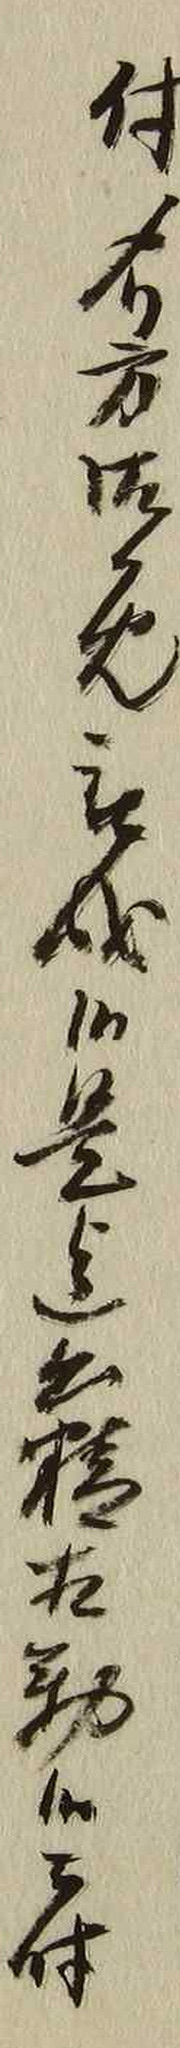付〆り方御免被成候是迄出精相勤候ニ付
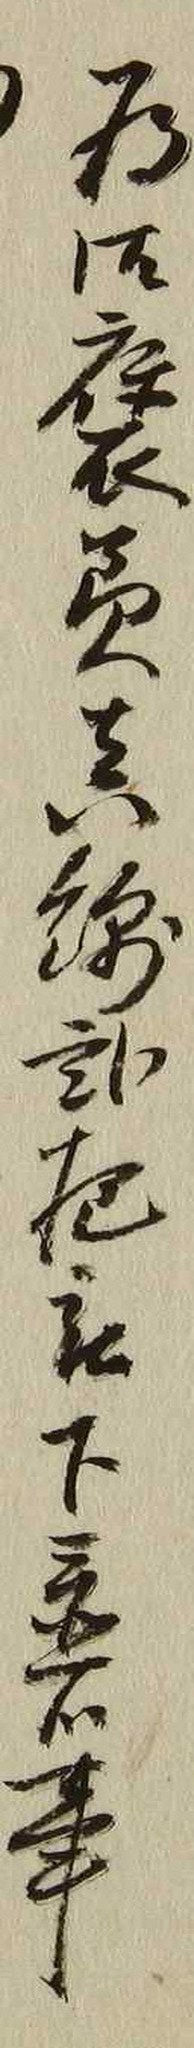為御褒美真綿弐把被下置候事
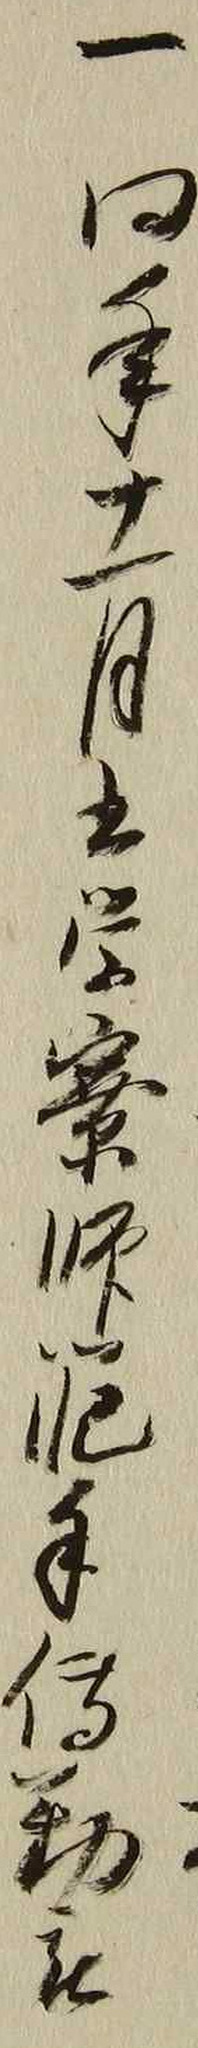一同年十一月書学寮師範手伝勤被
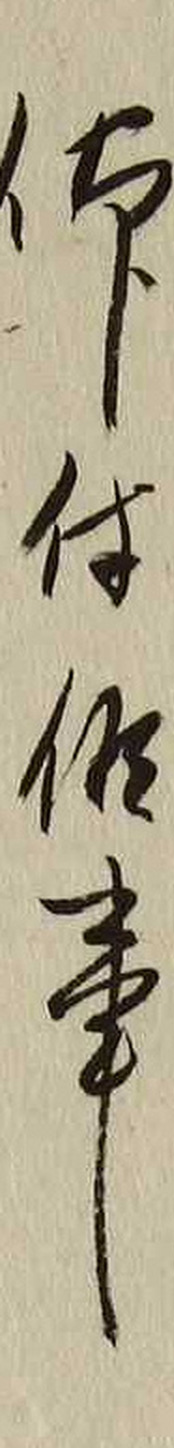仰付候事
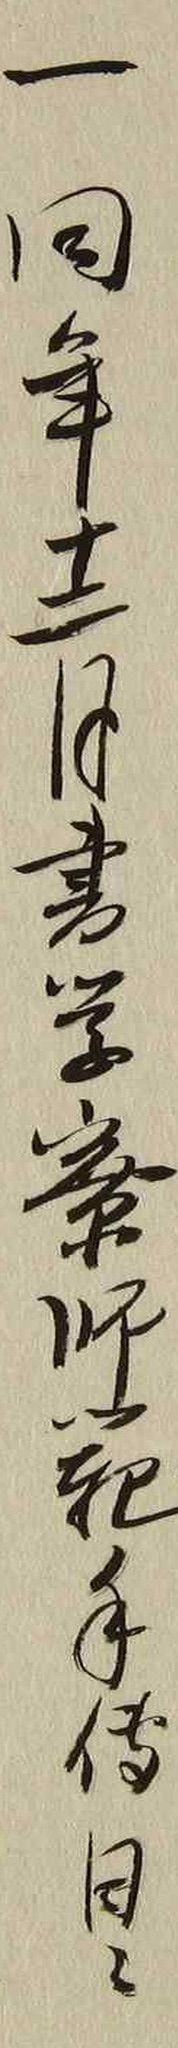一同年十二月書学寮師範手伝日々
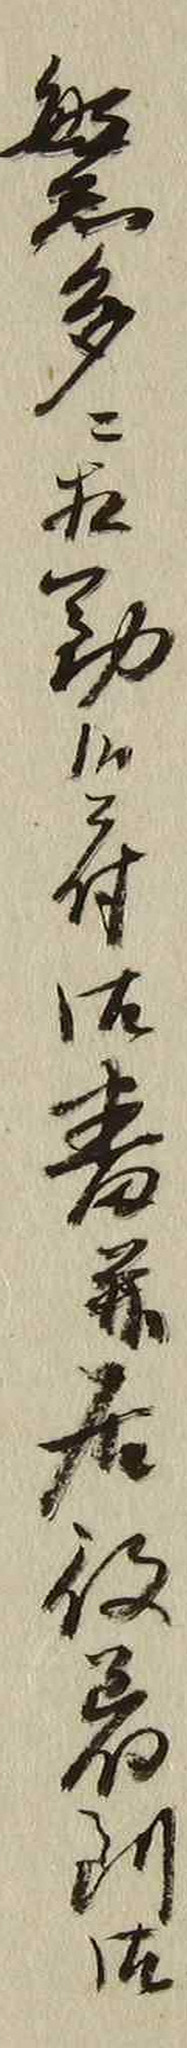繁多ニ相勤候ニ付御番并居役着到御
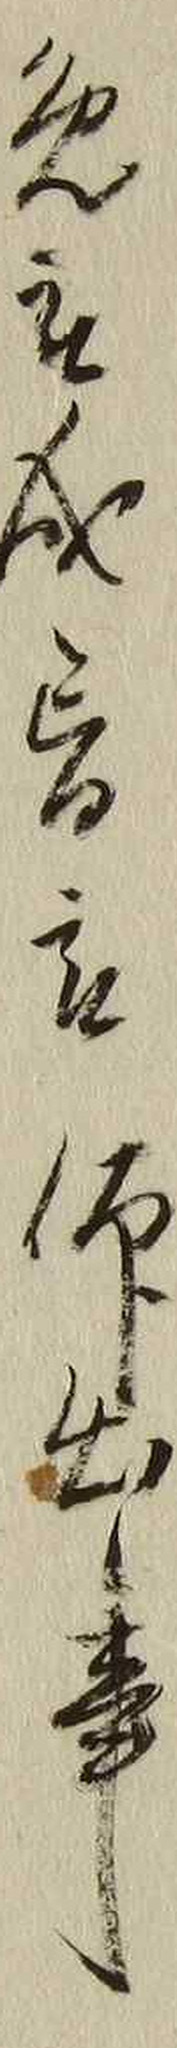免被成候旨被仰出候事
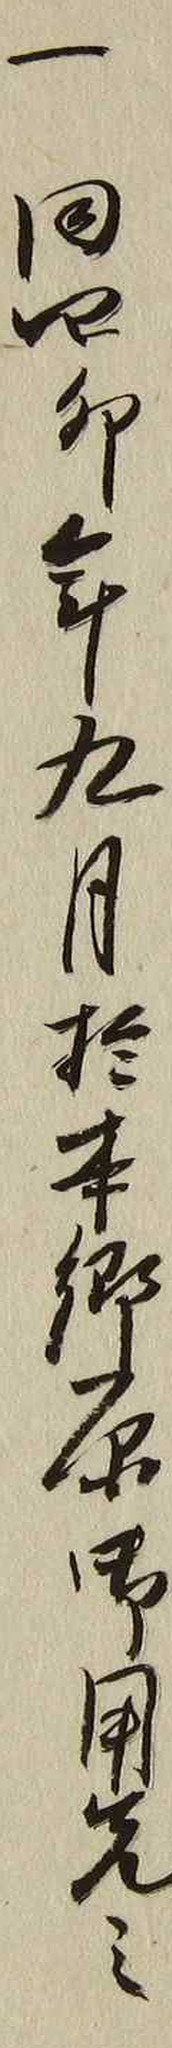一同四卯年九月於本郷原御用先之
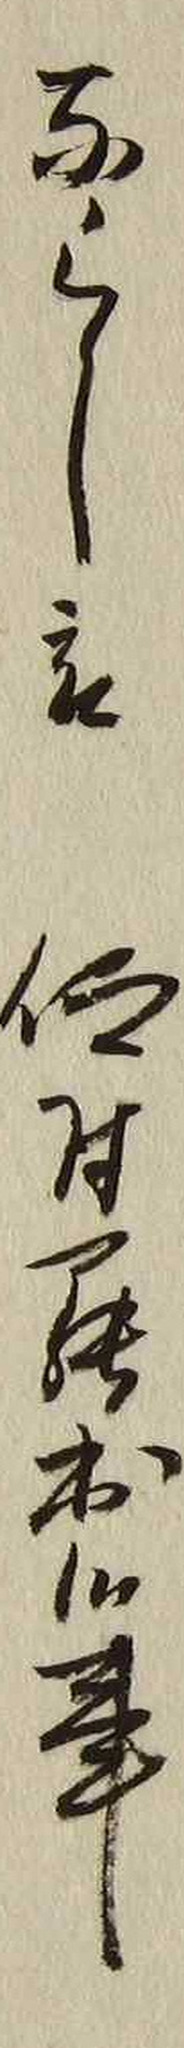ならし被仰付罷出候事
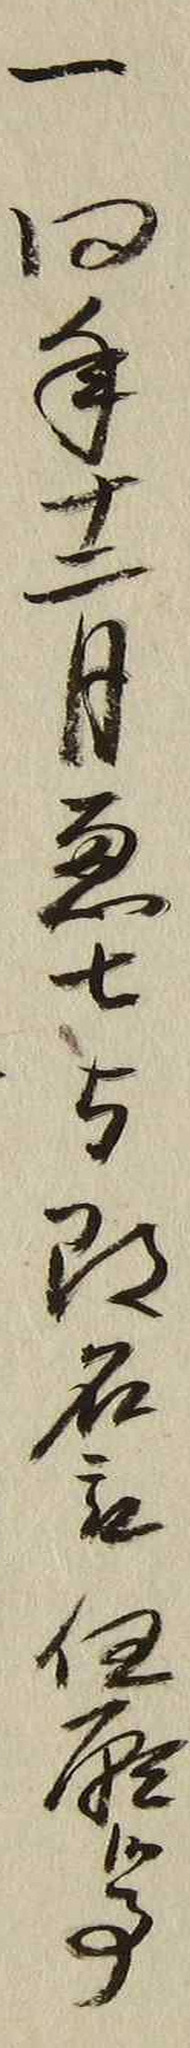一同年十二月恵七与改名被任願候事
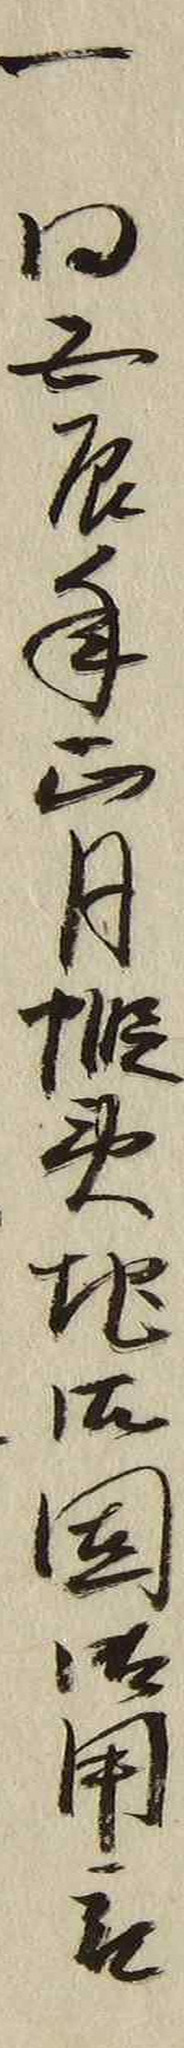一同五辰年正月蝦夷地御固御用被
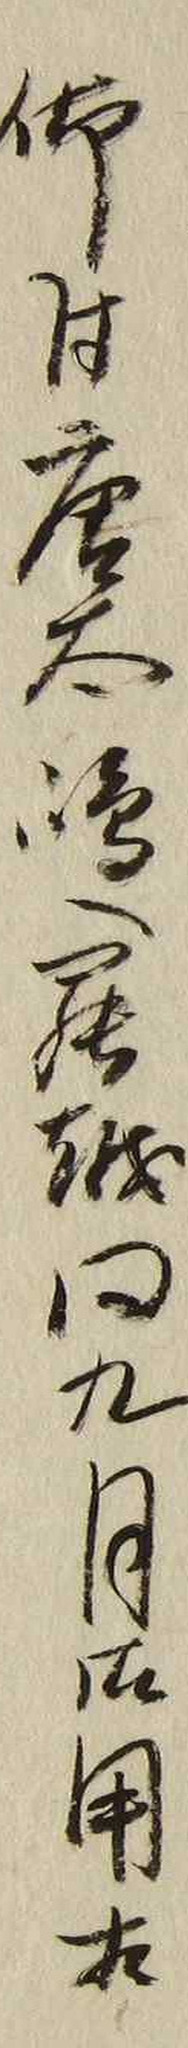】太島へ罷越同九月御用相
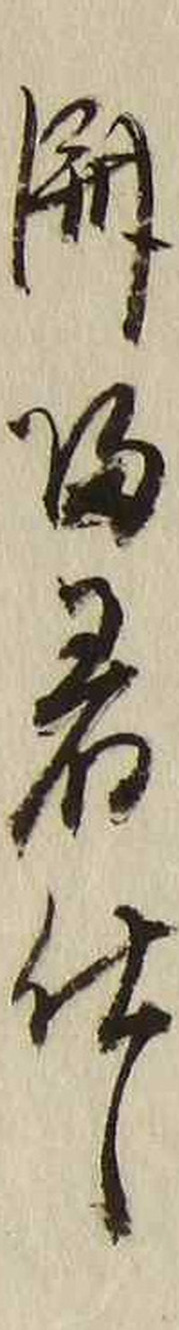済帰着仕候

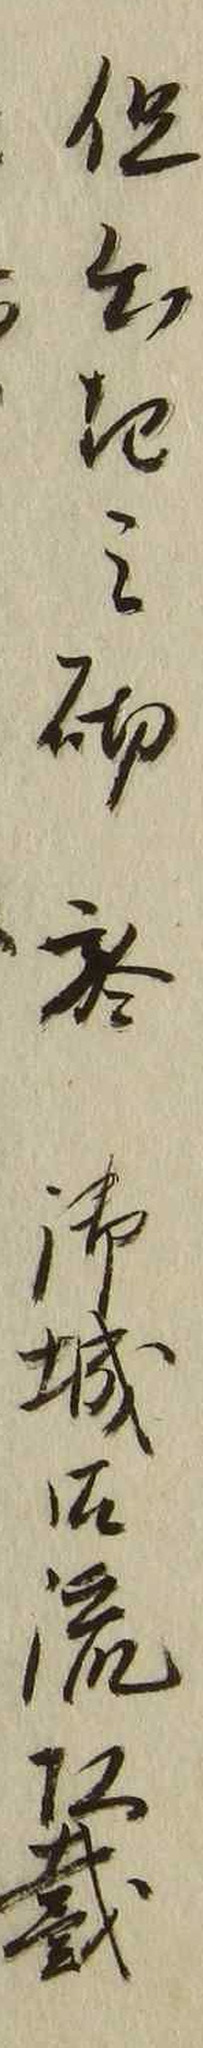但出起之砌於御城御流頂戴
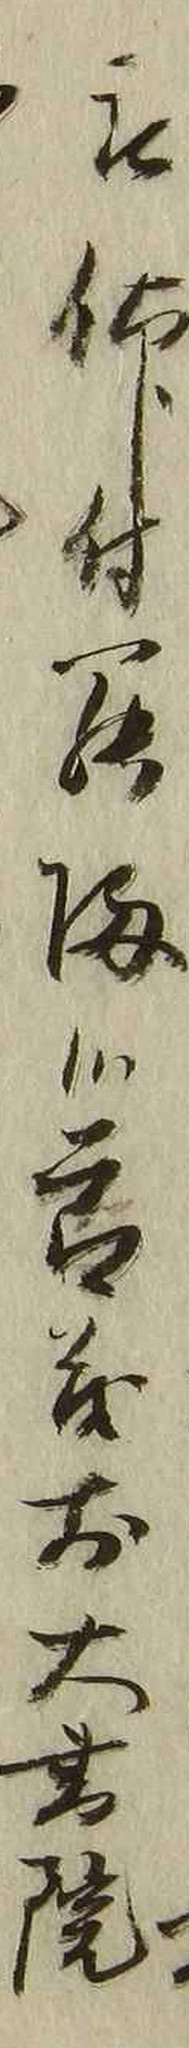被仰付罷帰候節茂於大書院
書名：諸士系譜　巻之349　も之部5
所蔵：会津若松市立会津図書館
